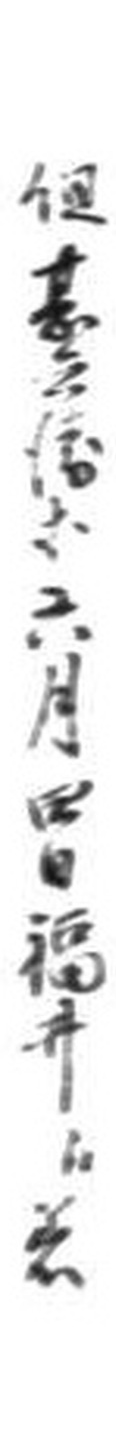但甚兵衛等六月四日福井江着
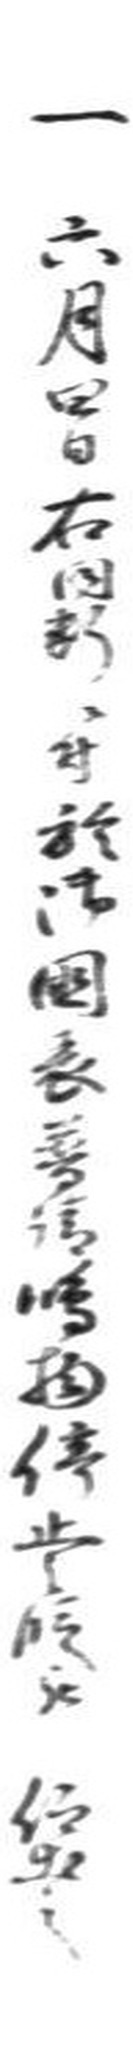一六月四日右同断ニ付於御国表普請鳴物停止之段被仰出之
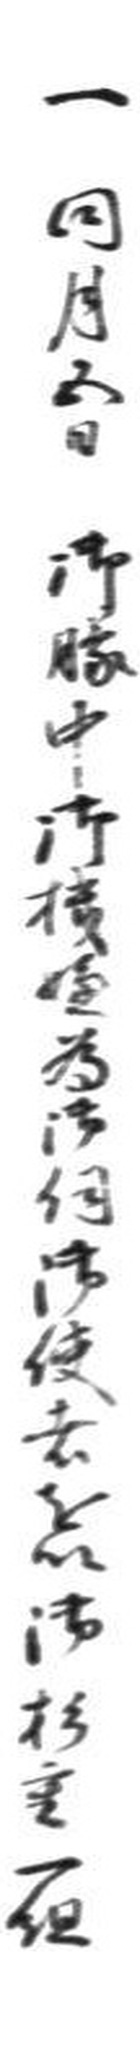一同月五日御朦中御機嫌為御伺御使者を以御杉重一組
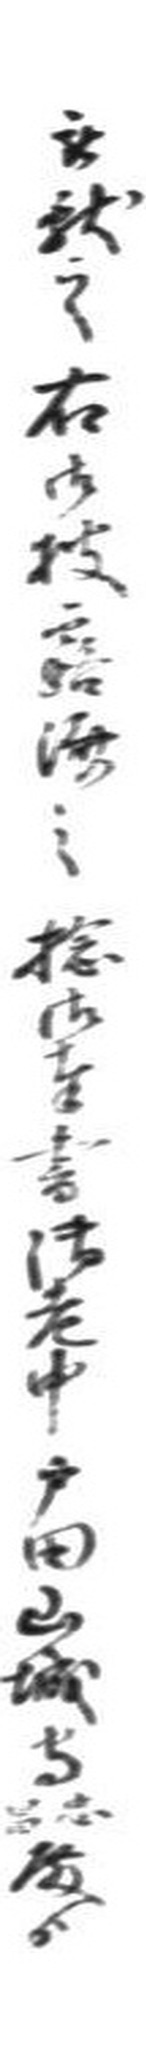被献之右御披露済之捻御奉書御老中戸田山城守忠昌殿ゟ

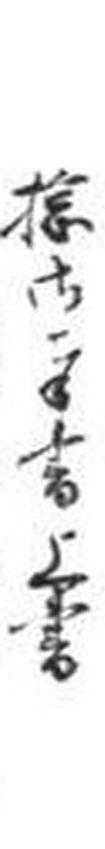捻御奉書上書
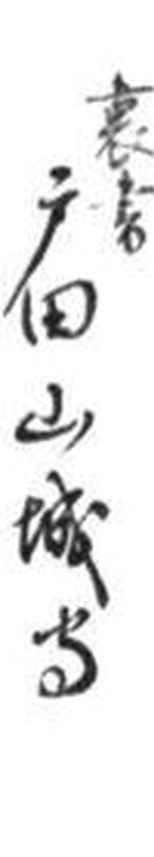戸田山城守
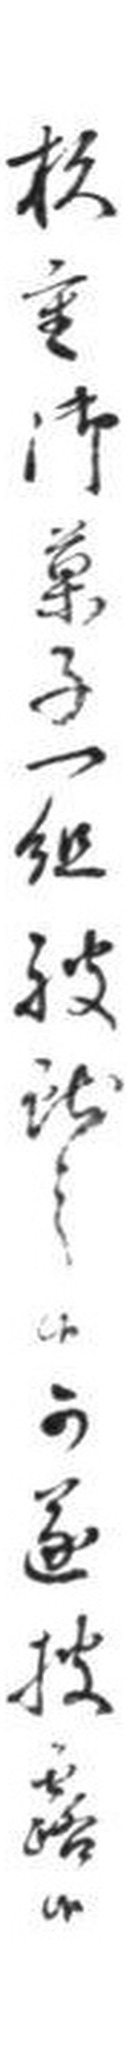杉重御菓子一組被献之候可遂披露候
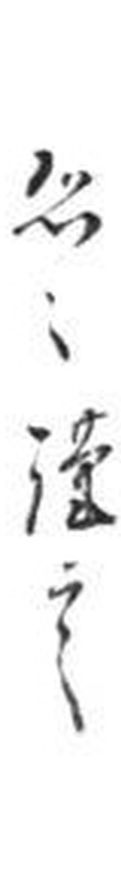恐々謹言
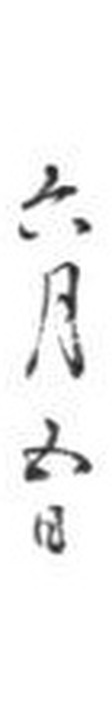六月五日
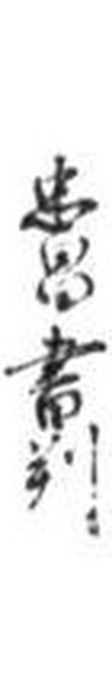忠昌書判
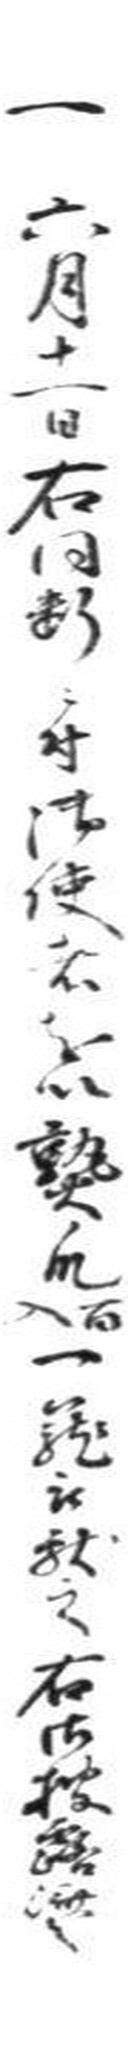一六月十一日右同断ニ付御使者を以熟瓜百入一籠被献之右御披露済之
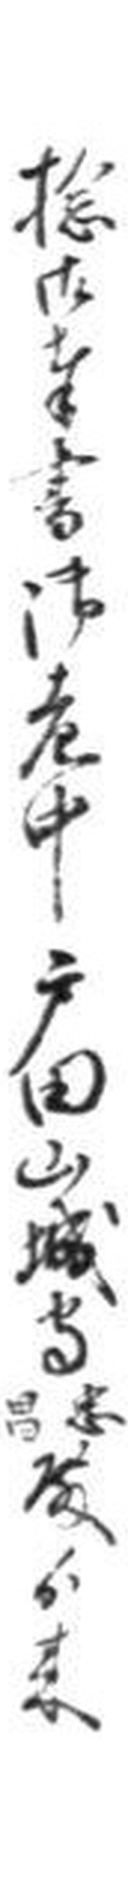捻御奉書御老中戸田山城守忠昌殿ゟ来
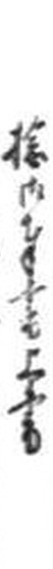捻御奉書上書
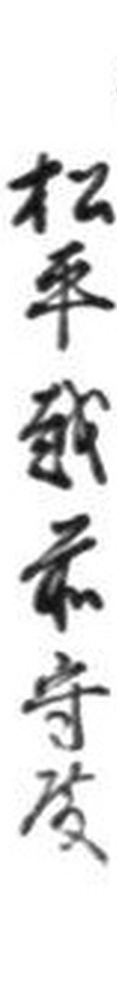松平越前守殿忠昌
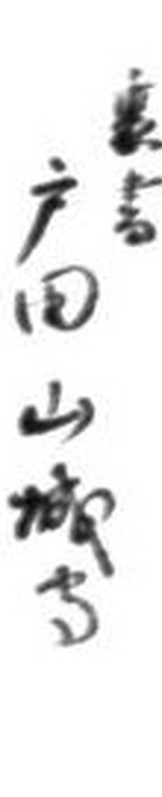戸田山城守
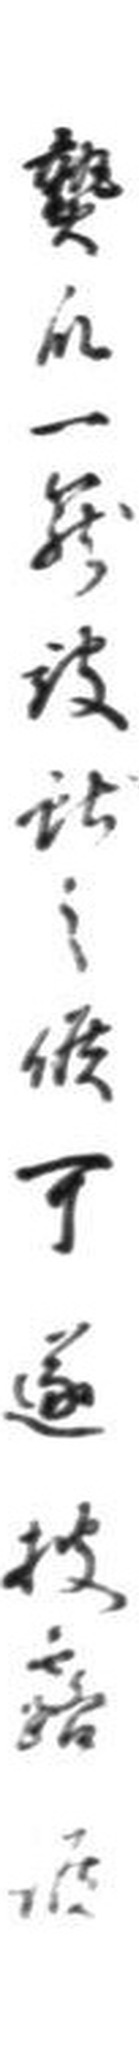熟瓜一籠被献之候可遂披露候
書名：家譜 十五 綱昌公 従天和元年到元禄十二年
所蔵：福井県文書館 Fukui Prefectural Archives
